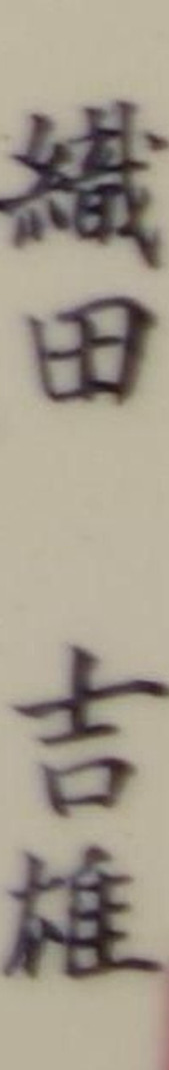織田吉雄
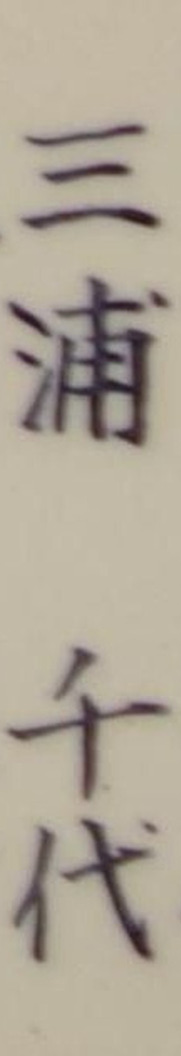三浦千代
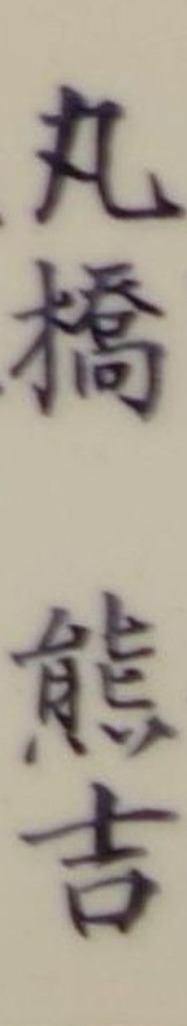丸橋熊吉
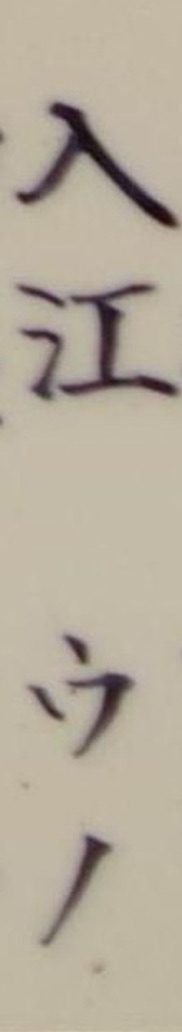入江ウノ
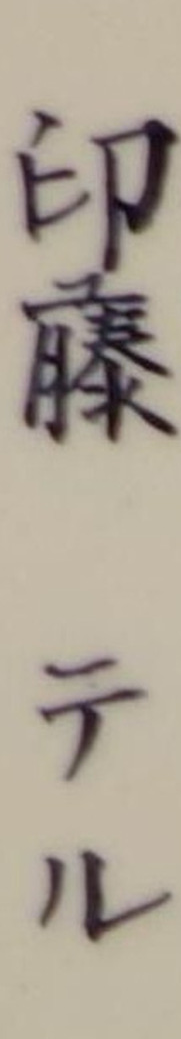印藤テル
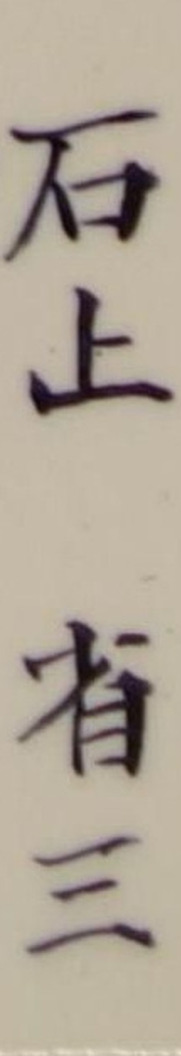石止省三
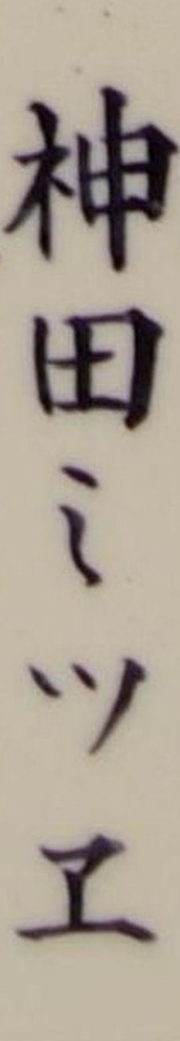神田ミツヱ
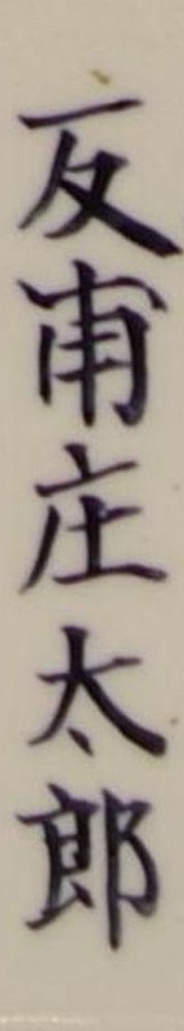反甫庄太郎
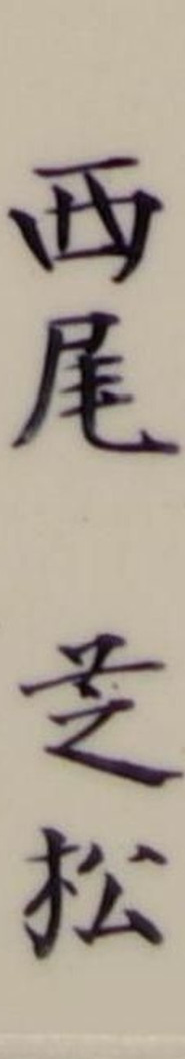西尾芝松
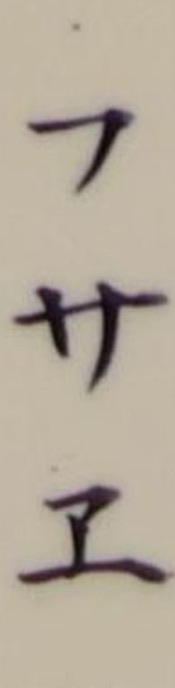フサエ
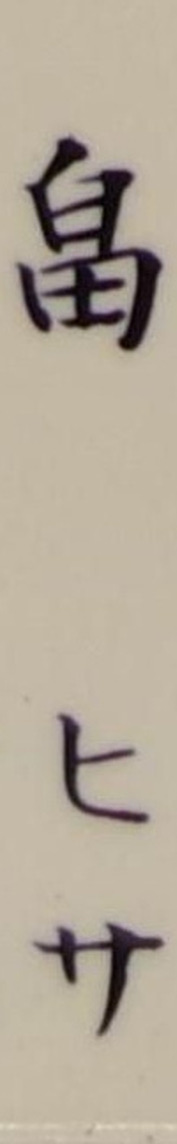畠ヒサ
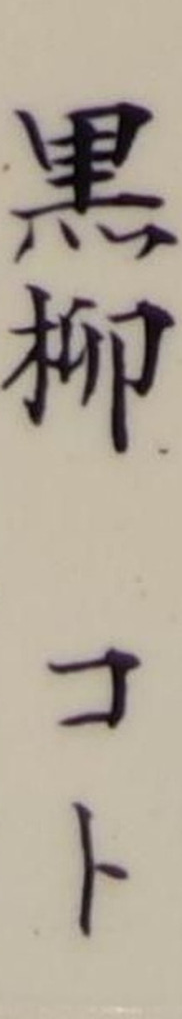黒柳コト
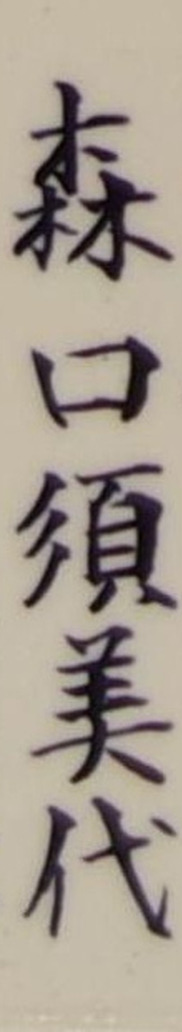森口須美代
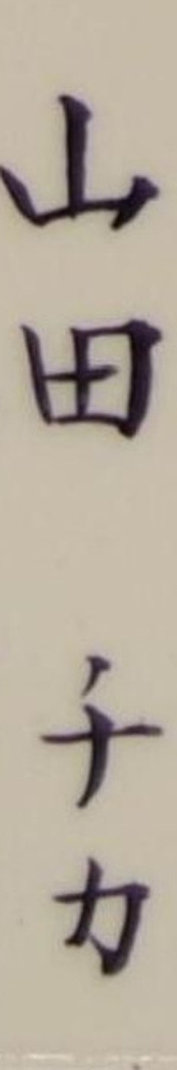山田チカ
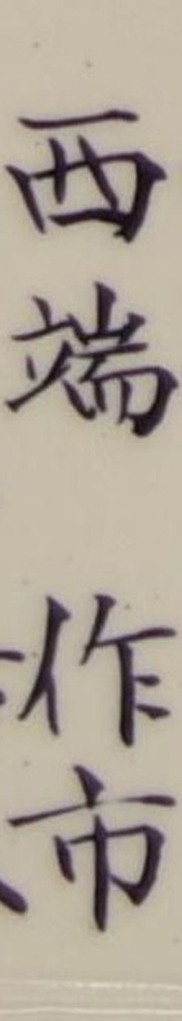西端作市

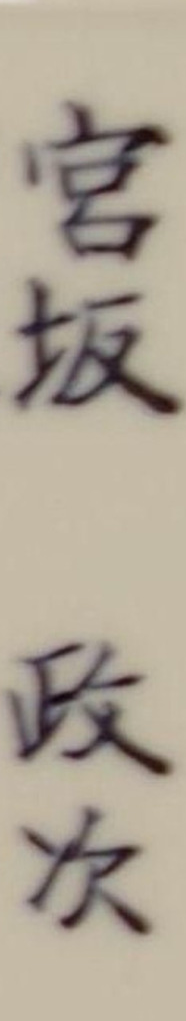宮坂政次
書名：M~S
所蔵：高野山金剛峯寺
